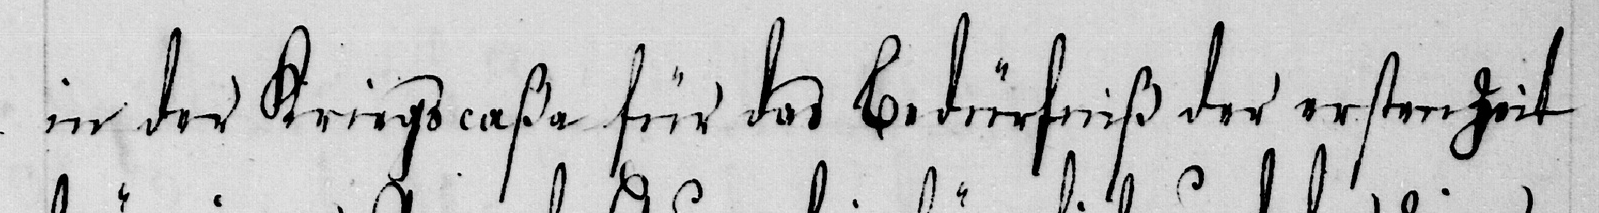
in der Kriegscaßa für das Bedürfniß der ersten Zeit
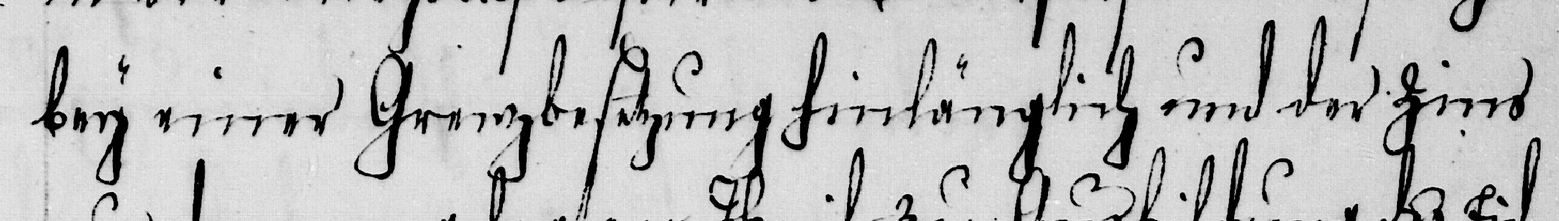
bey einer Grenzbesetzung hinlänglich und der Zins
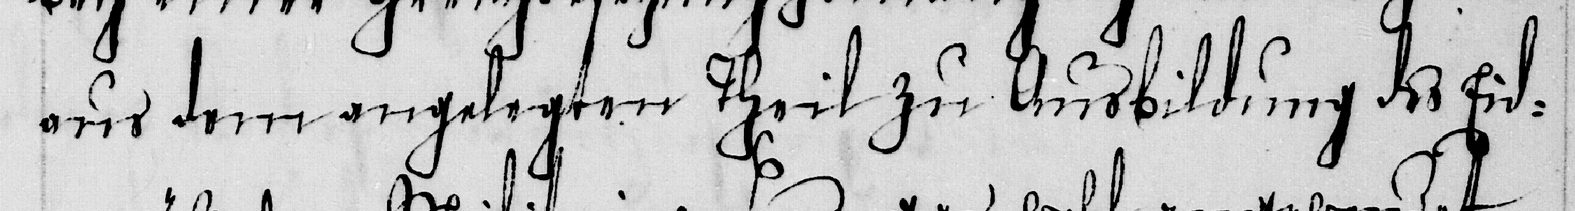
aus dem angelegten Theil zu Ausbildung des Eid¬
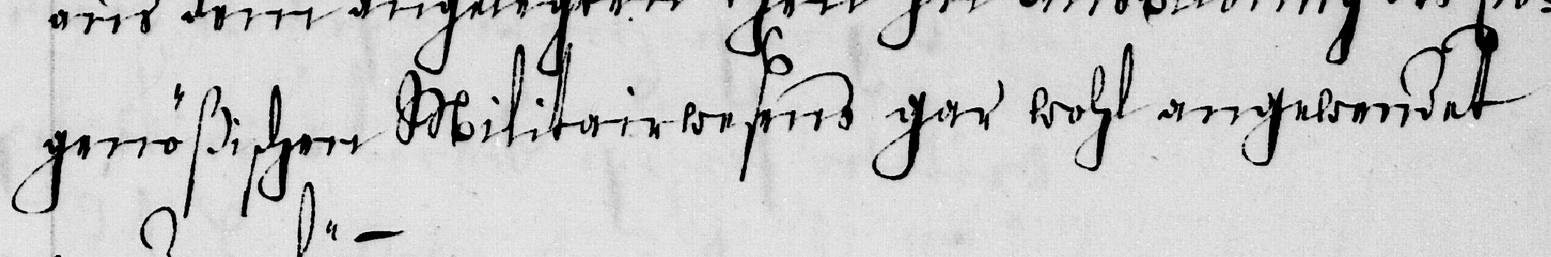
genößischen Militairwesens gar wohl angewendet
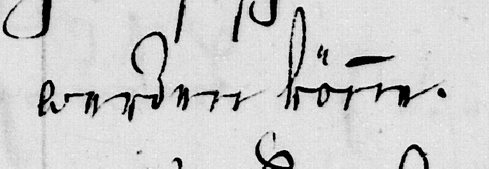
werden könne.
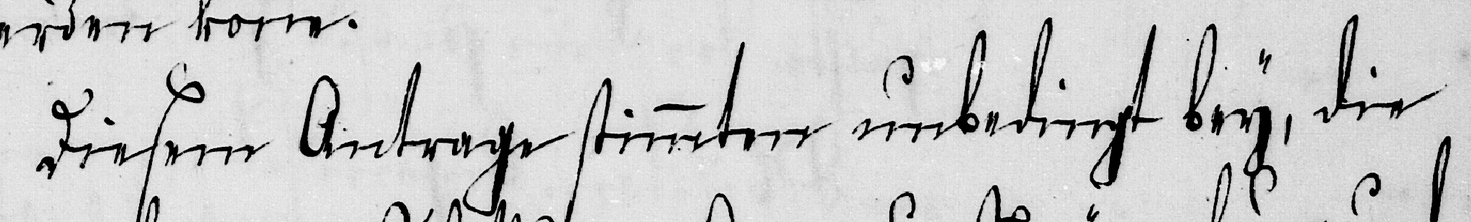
Diesem Antrage stimmten unbedingt bey, die
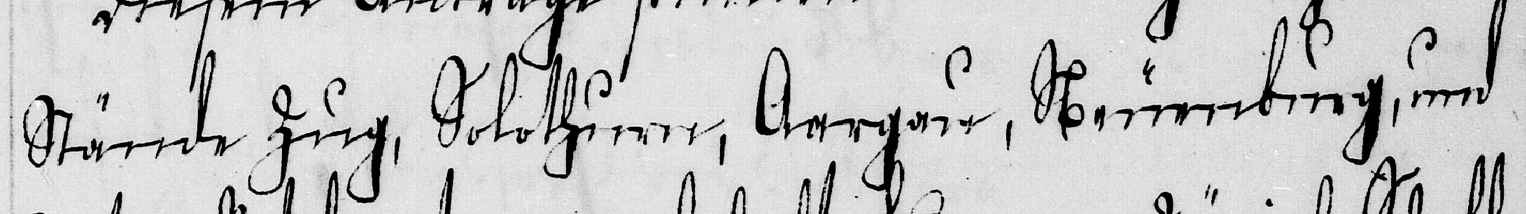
Stände Zug, Solothurn, Aargau, Neuenburg, und
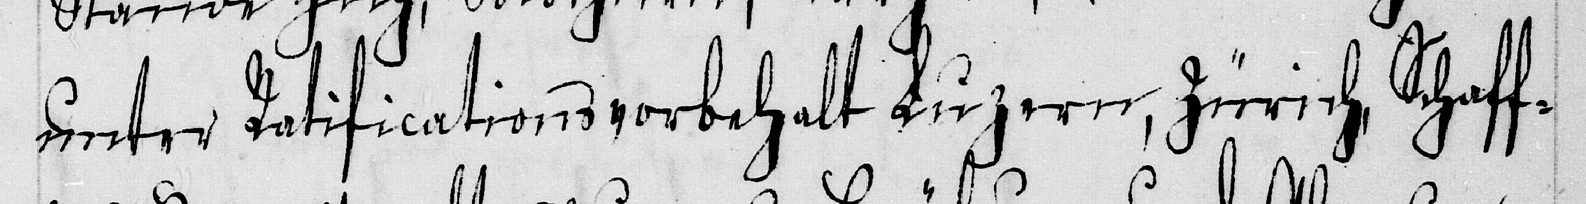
unter Ratificationsvorbehalt Luzern, Zürich, Schaff¬
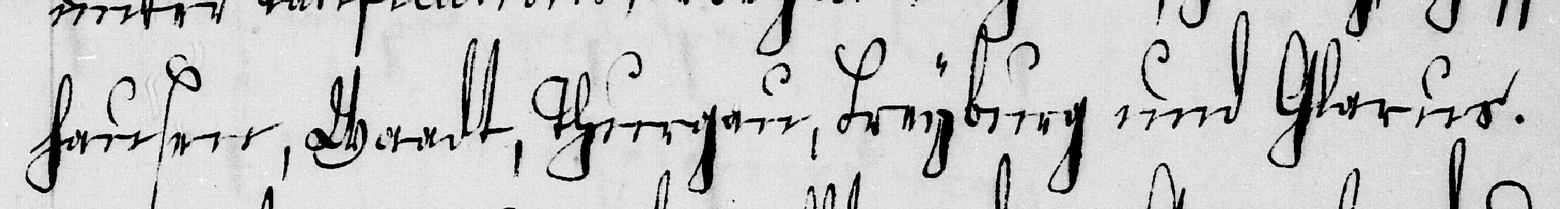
hausen, Waadt, Thurgau, Freyburg und Glarus.
